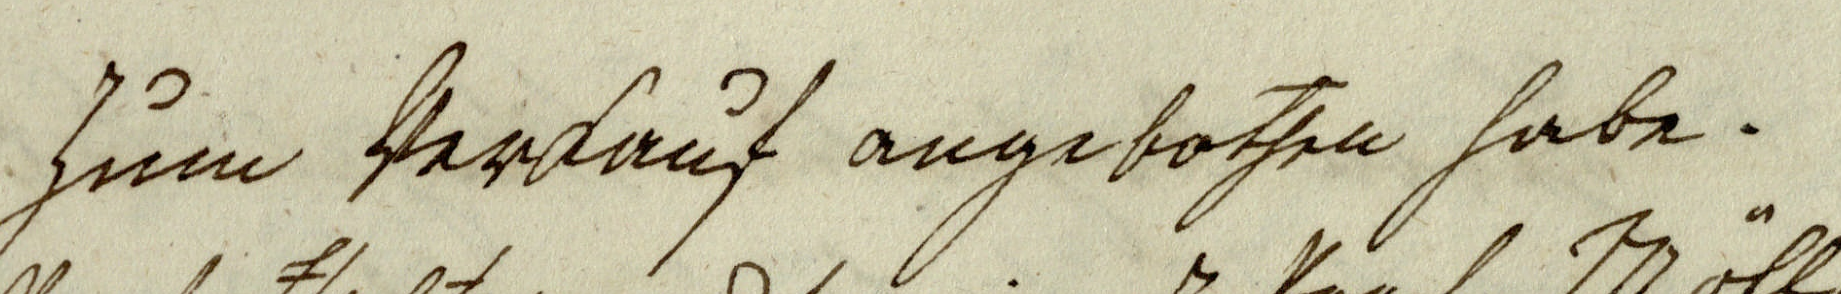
zum Verkauf angebothen habe.
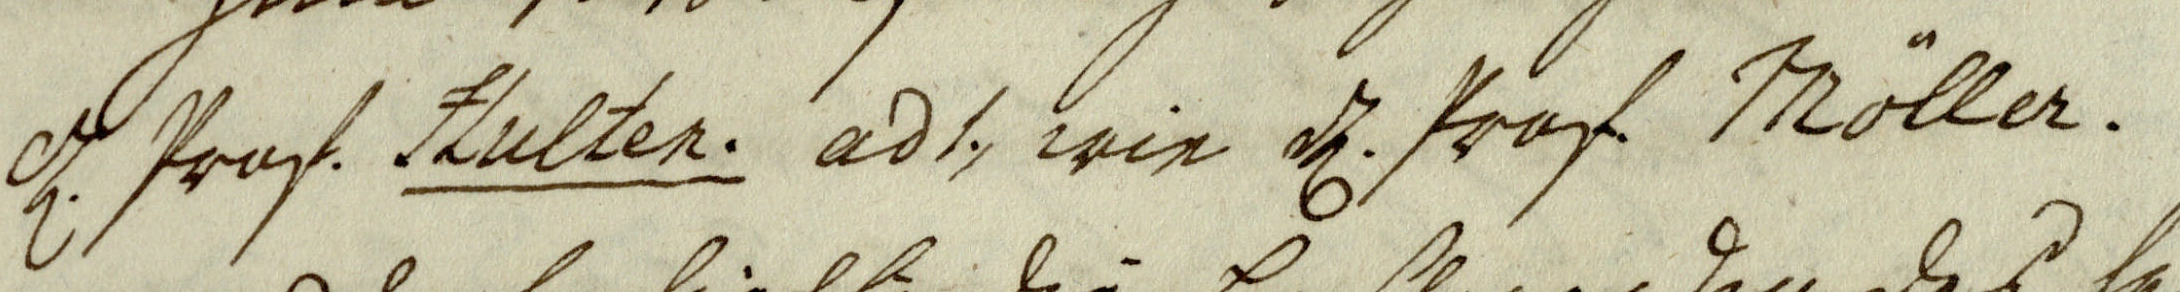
dh. Prof. Hulten. ad 1., wie dh. Prof. Möller.
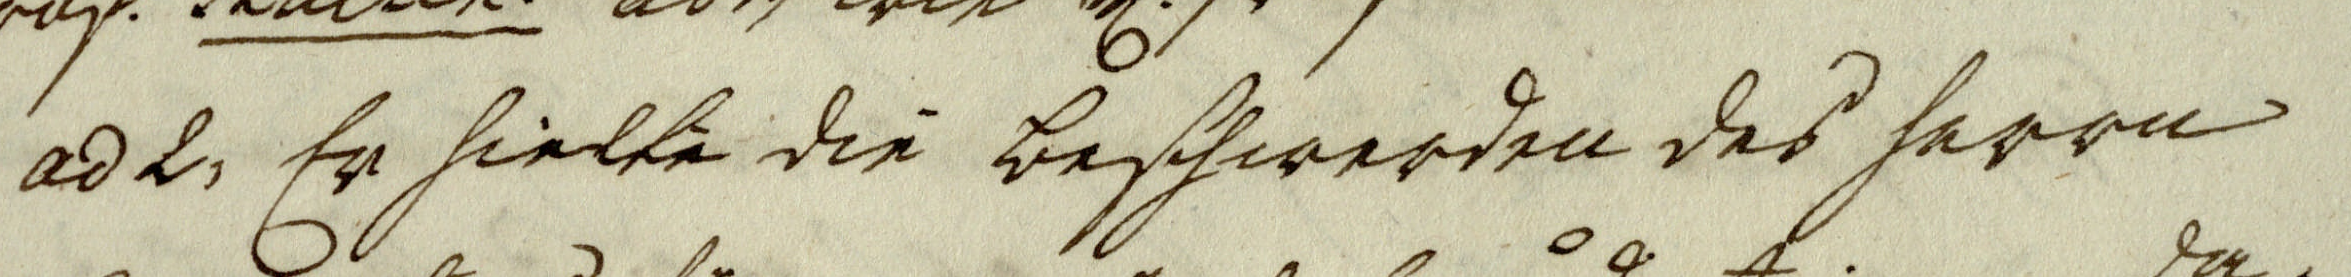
ad 2, Er hielte die Beschwerden des Herrn
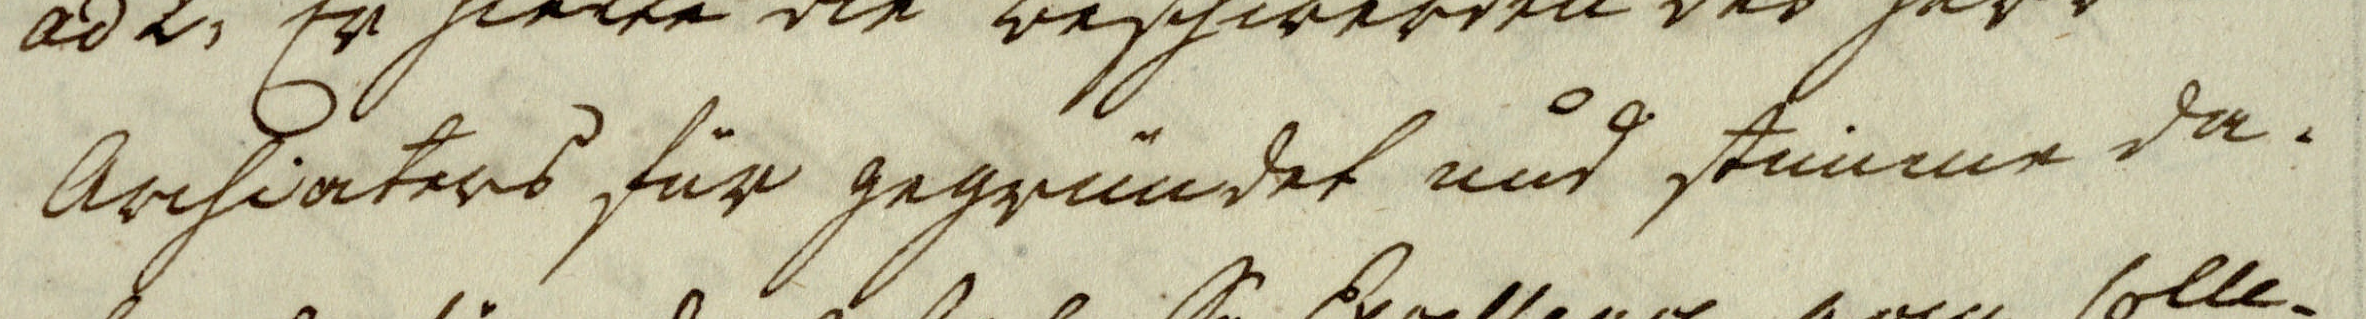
Archiaters für gegründet und stimme da¬
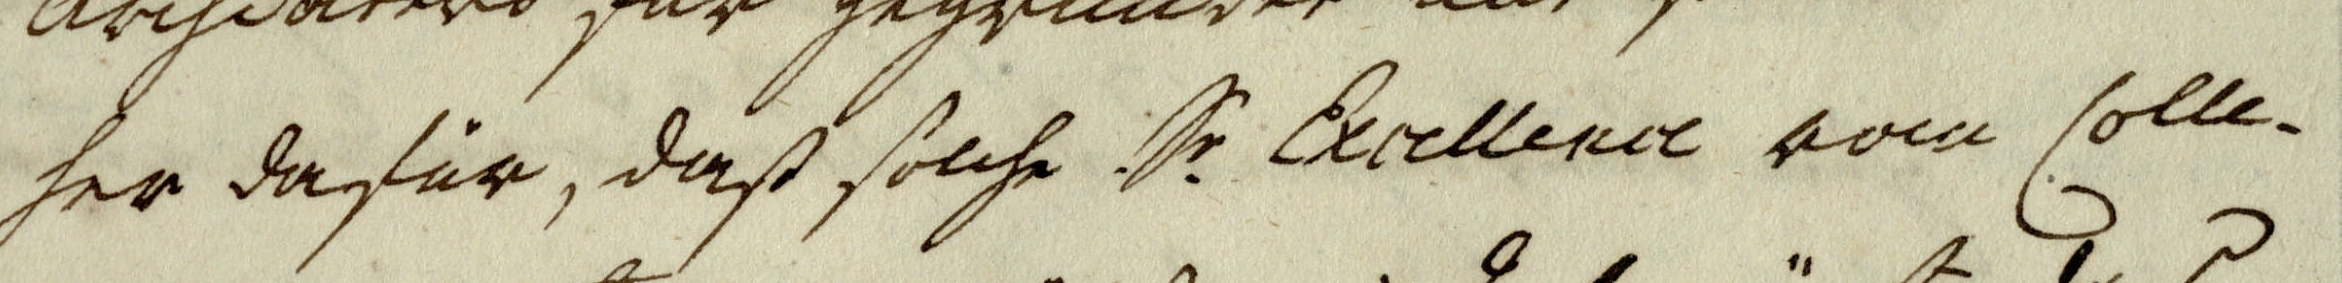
her dafür, daß solche Sr Excellence vom Colle¬
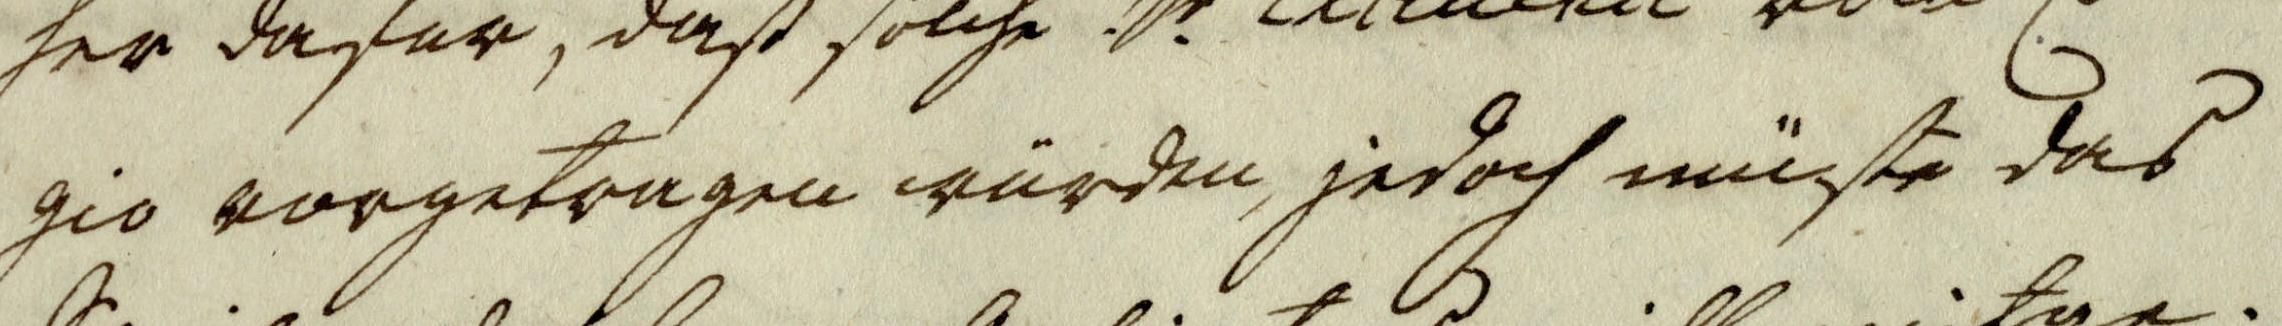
gio vorgetragen würden, jedoch müßte das
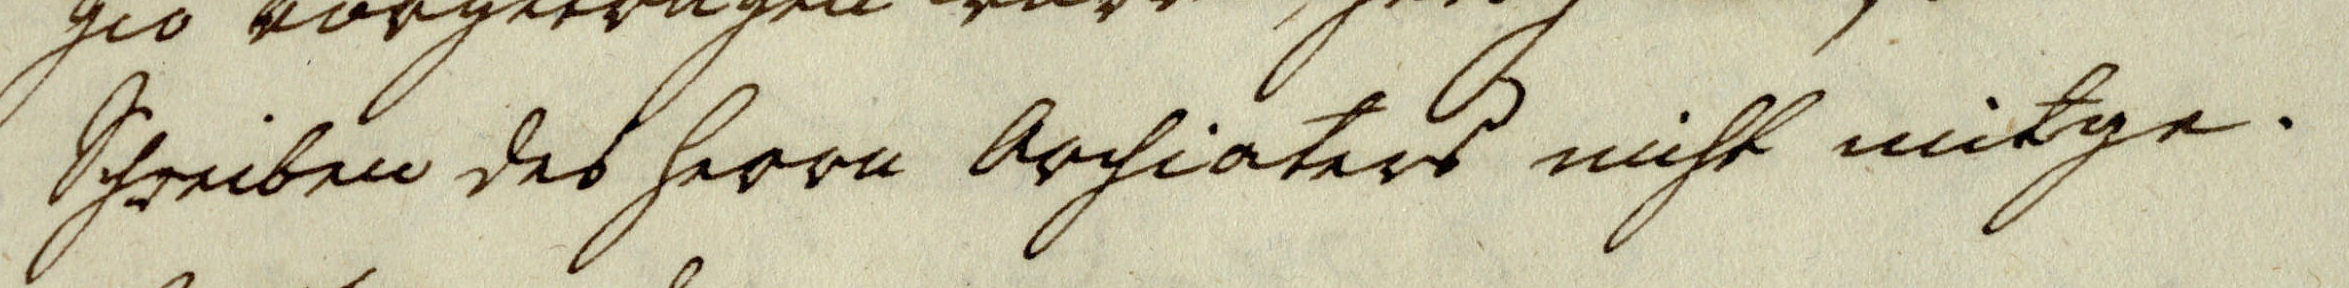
Schreiben des Herrn Archiaters nicht mitge¬
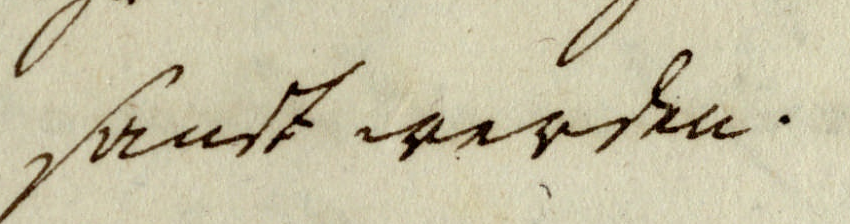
sandt werden.
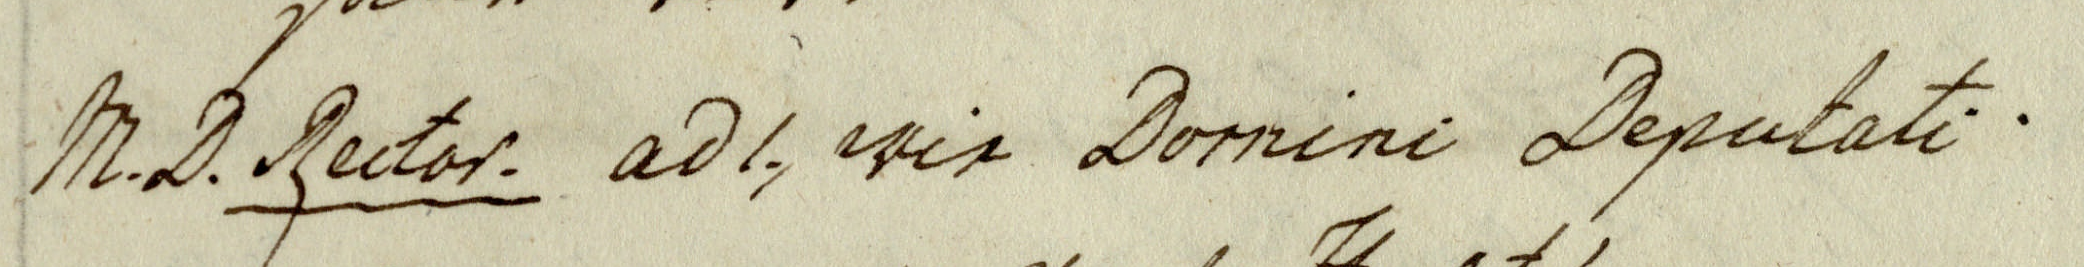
M. D. Rector. ad 1., wie Domini Deputati.
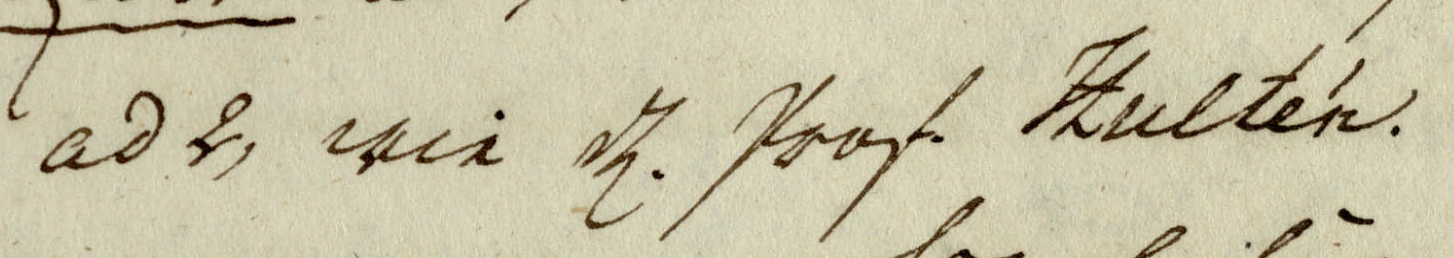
ad 2., wie dh. Prof. Hultén.
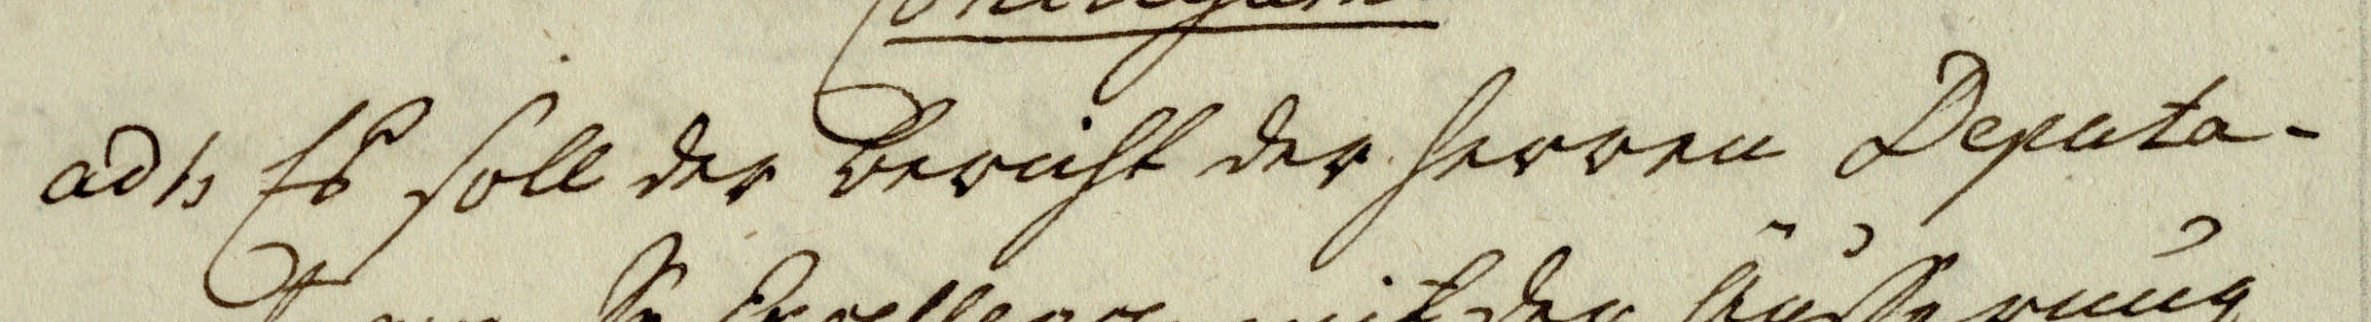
ad 1. Es soll der Bericht der Herren Deputa¬
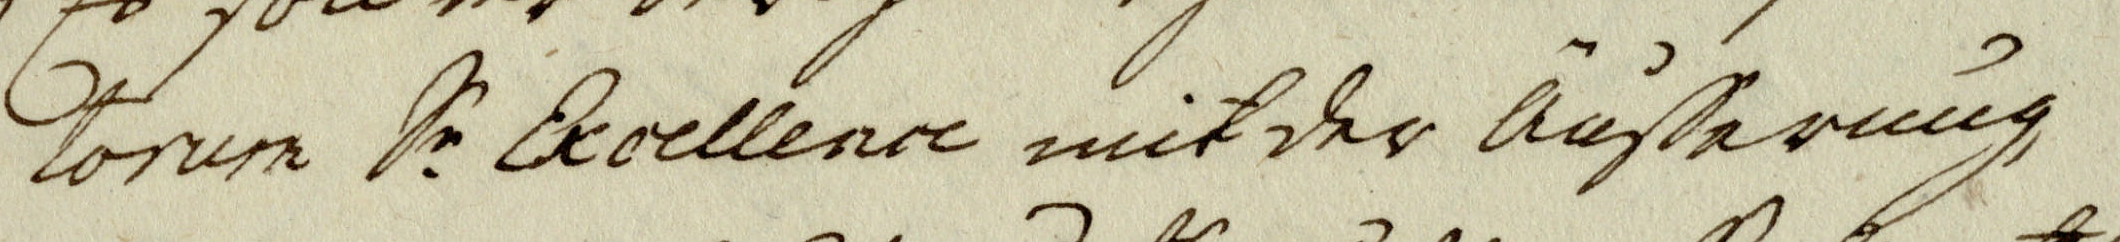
torum Sr Excellence mit der Äusserung,
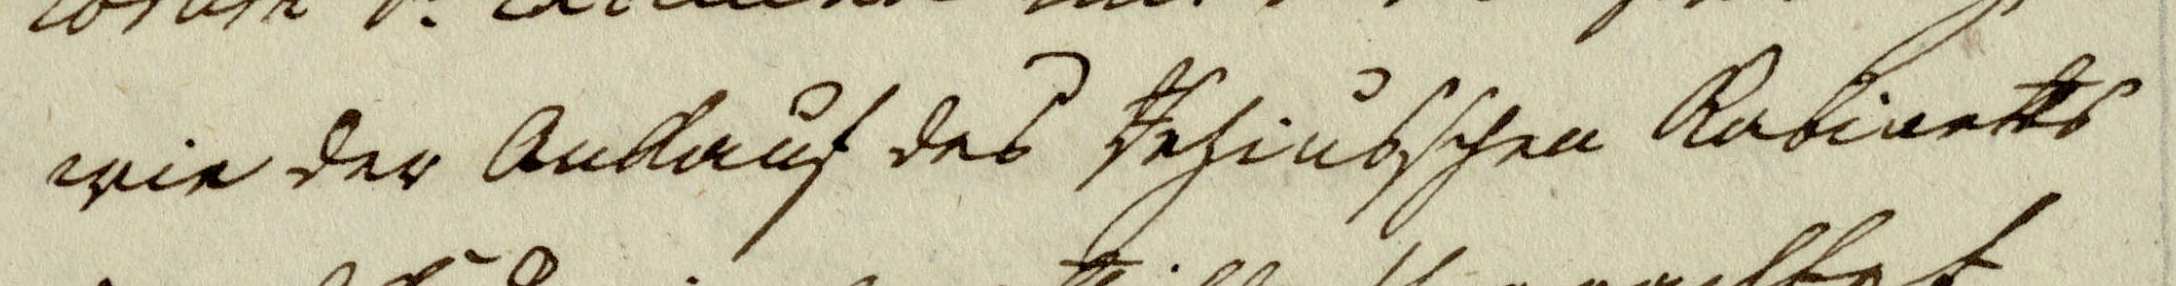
wie der Ankauf des Reziusschen Kabinetts
